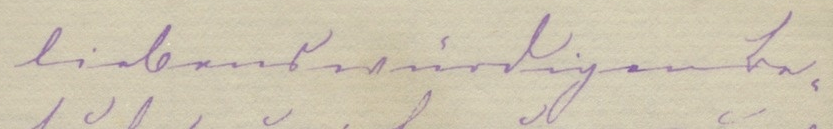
liebenswürdigen Be-
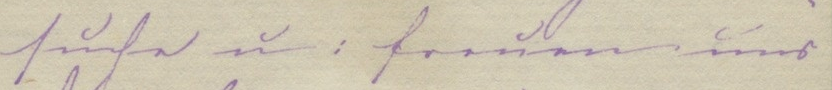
suche u: freuen uns
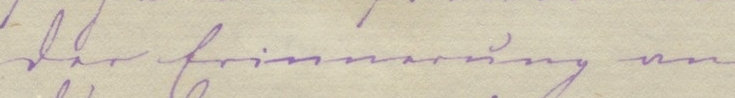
der Erinnerung an
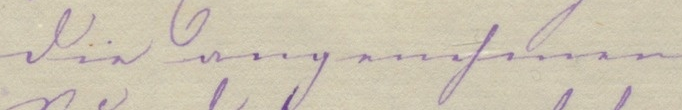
die angenehmen
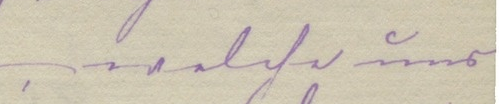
welche uns
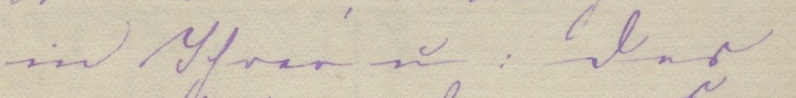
in Ihrer u: des
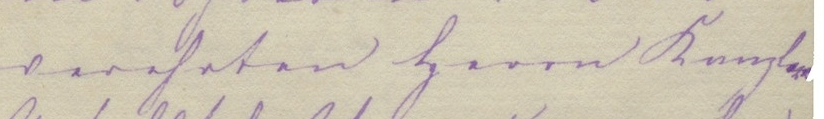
verehrten Herrn Kanzlers
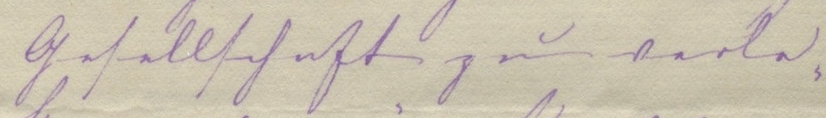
Gesellschaft zu verle-
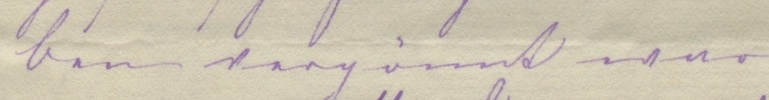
ben vergönnt war.
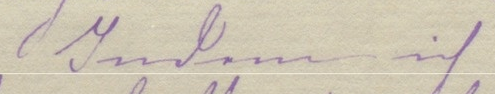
Indem ich
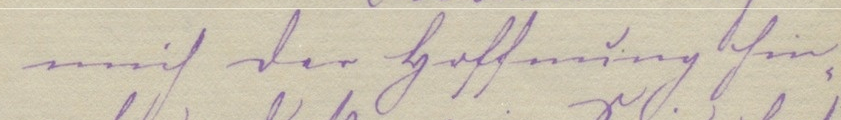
mich der Hoffnung hin-
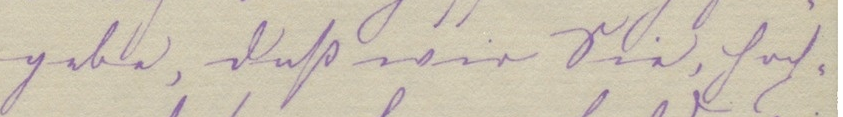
gebe, daß wir Sie, hoch-
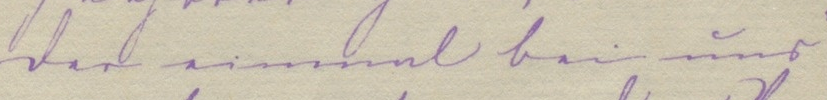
der einmal bei uns
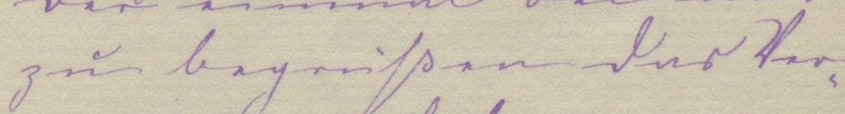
zu begrüßen das Ver-
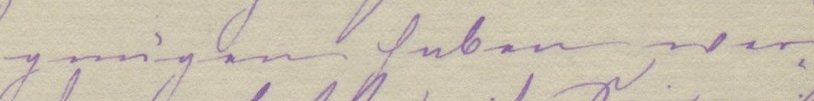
gnügen haben wer-
